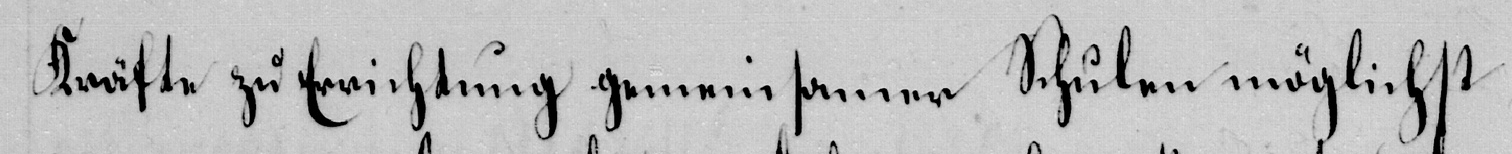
Kräfte zu Errichtung gemeinsamer Schulen möglichst
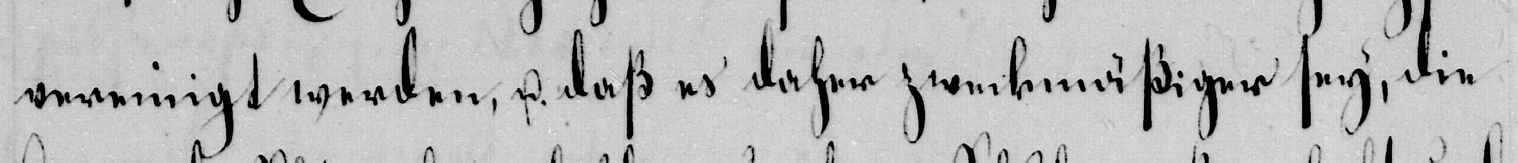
vereinigt werden, u. daß es daher zweckmäßiger sey, die
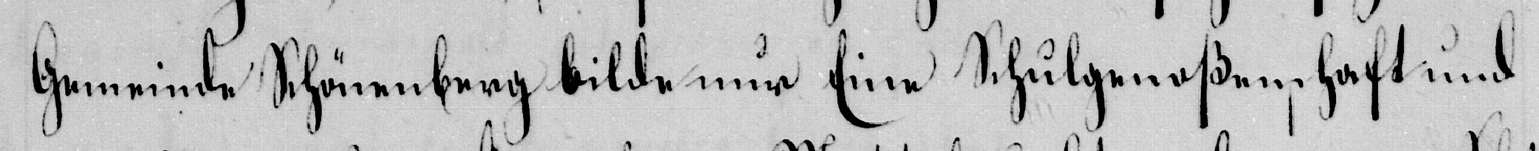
Gemeinde Schönenberg bilde nur Eine Schulgenoßenschaft und
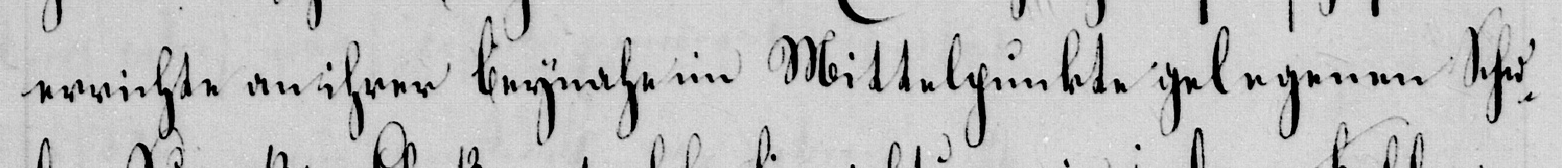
errichte an ihrer beynahe im Mittelpunkte gelegenen Schu¬
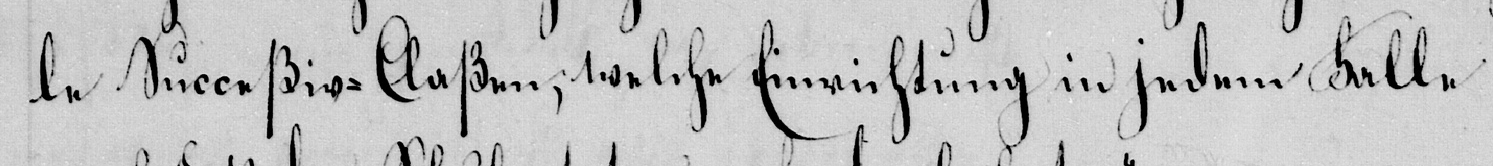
le Succeßiv-Claßen, welche Einrichtung in jedem Falle
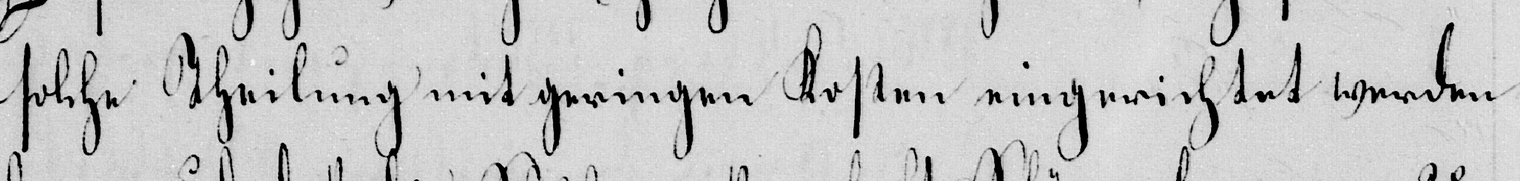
solche Theilung mit geringen Kosten eingerichtet werden
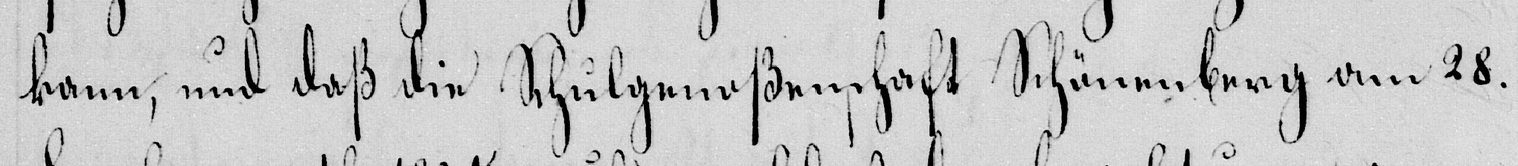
kann, und daß die Schulgenoßenschaft Schönenberg am 28.
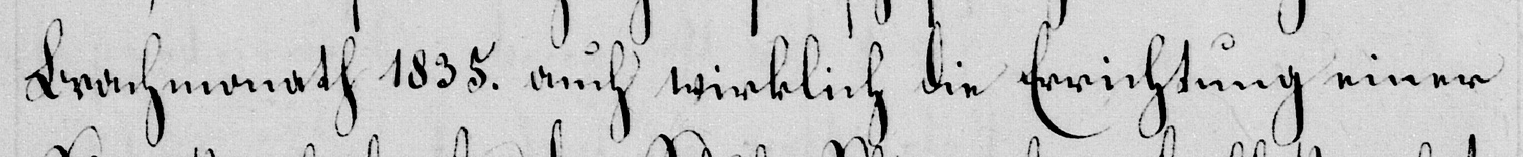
Brachmonath 1835. auch wirklich die Errichtung einer
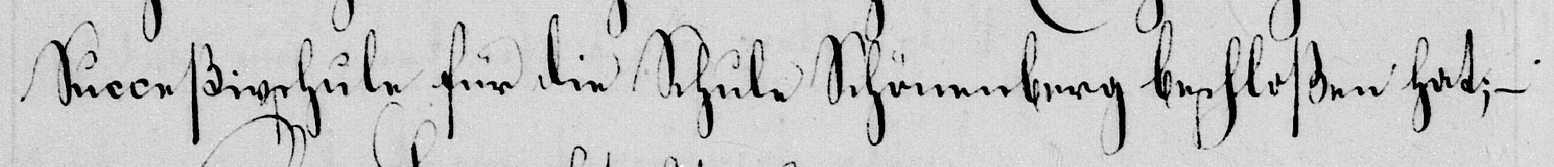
Succeßivschule für die Schule Schönenberg beschloßen hat; –
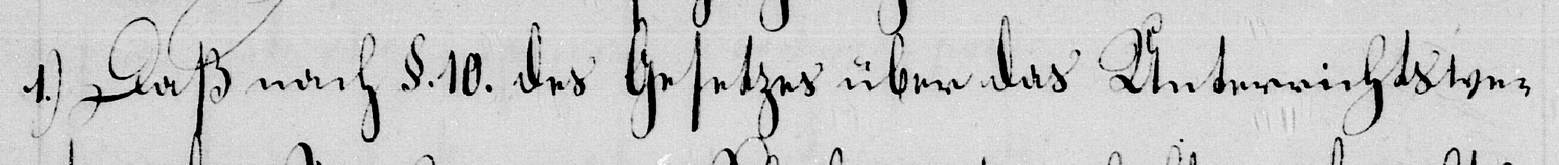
1.) Daß nach §. 10. des Gesetzes über das Unterrichtswe¬
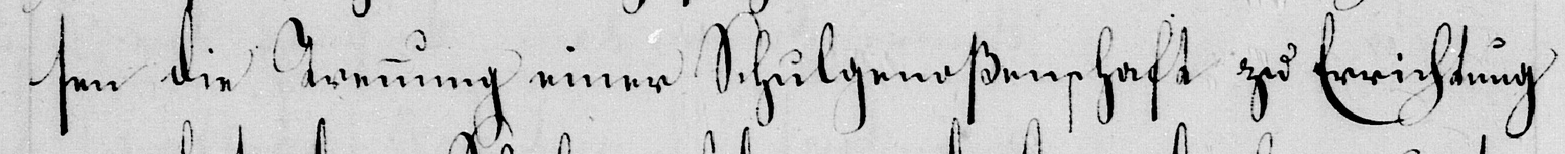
sen die Trennung einer Schulgenoßenschaft zu Errichtung
